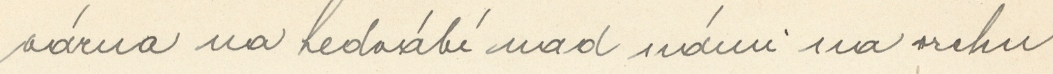várna na hedvábí nad námi na vrchu
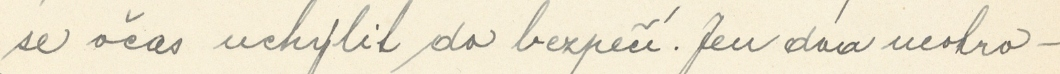se včas uchýlit do bezpečí. Jen dva neohro-
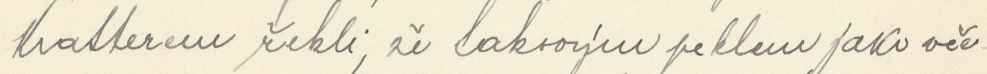Kratterem řekli, že takovým peklem jako vče-
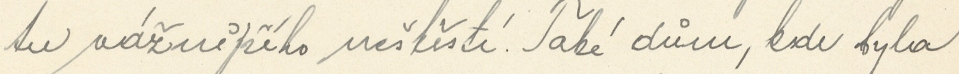tu vážnějšího neštěstí. Také dům, kde byla
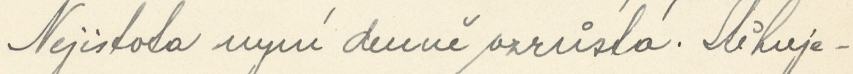Nejistota nyní denně vzrůstá. Stěhuje-
